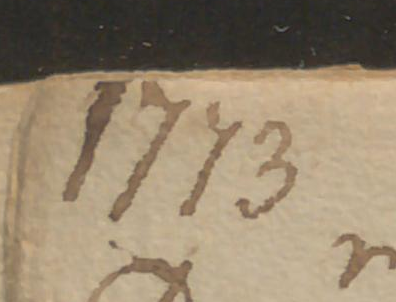1773
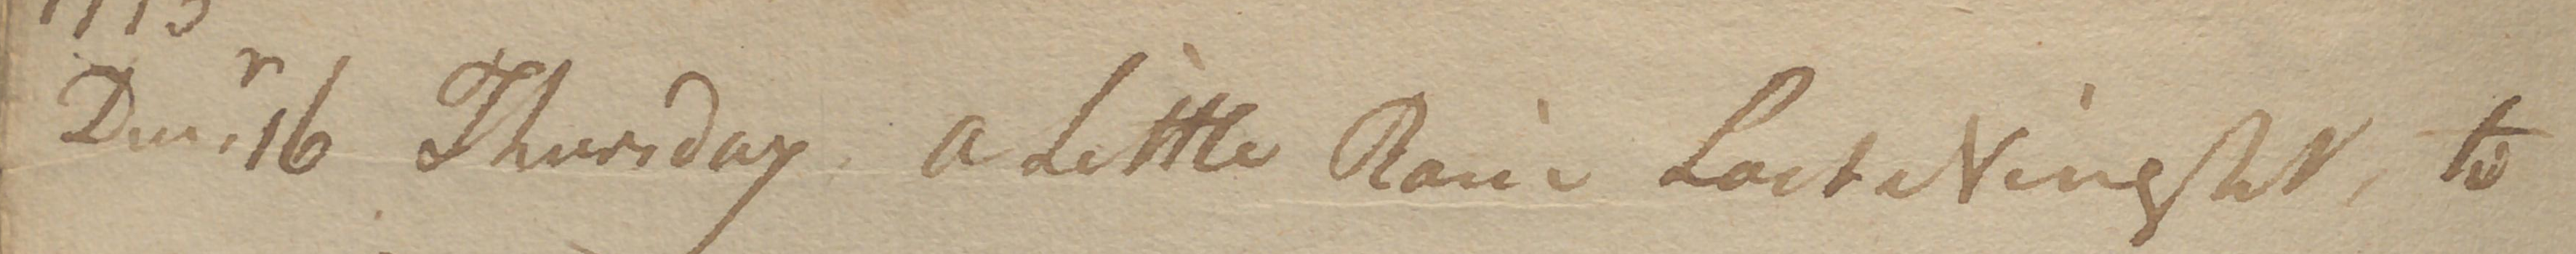Dec^r. 16 Thursday a Little Rain Last Night, to
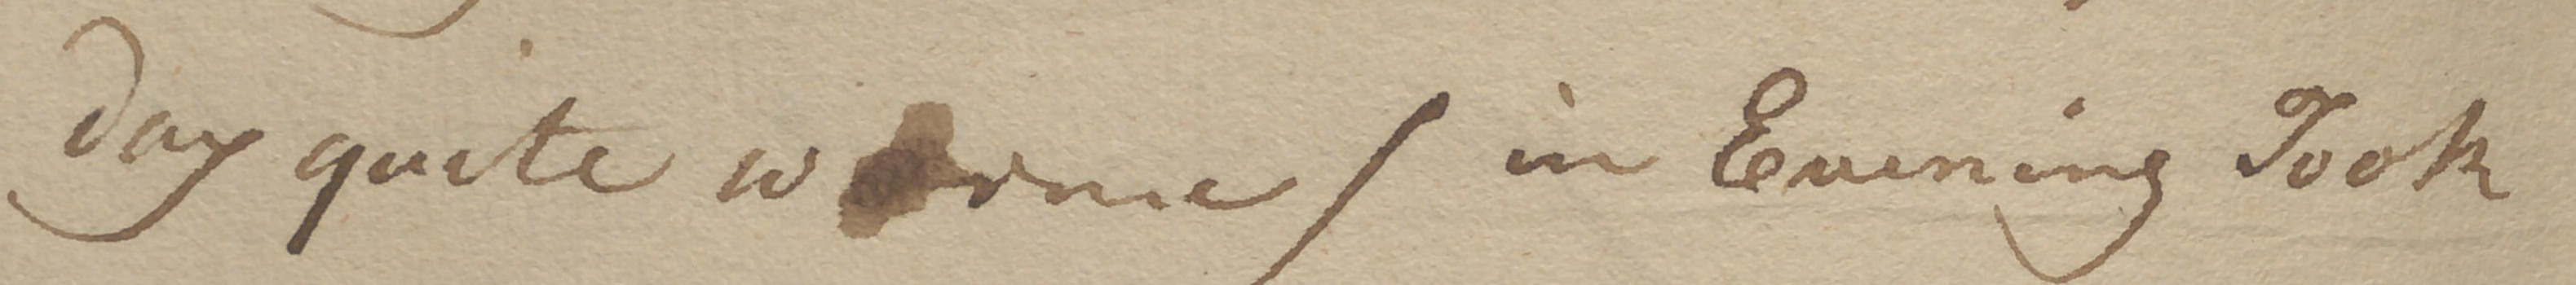day quite warme / in Evening Took
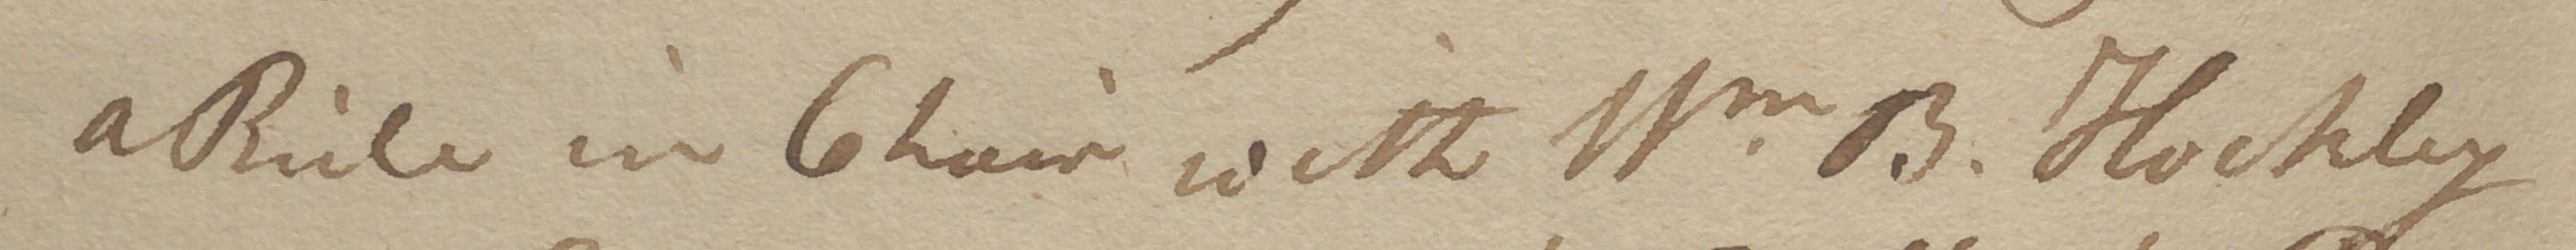a Ricle in Chair with W^m. B. Hockley
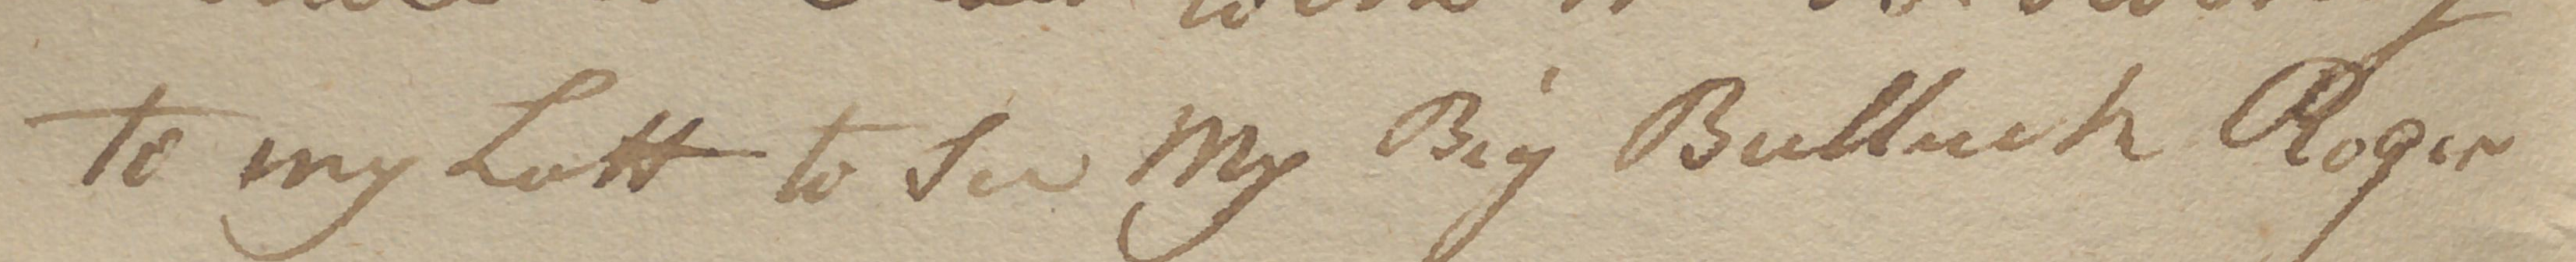to my Lott to see My Big Bulluck Roger
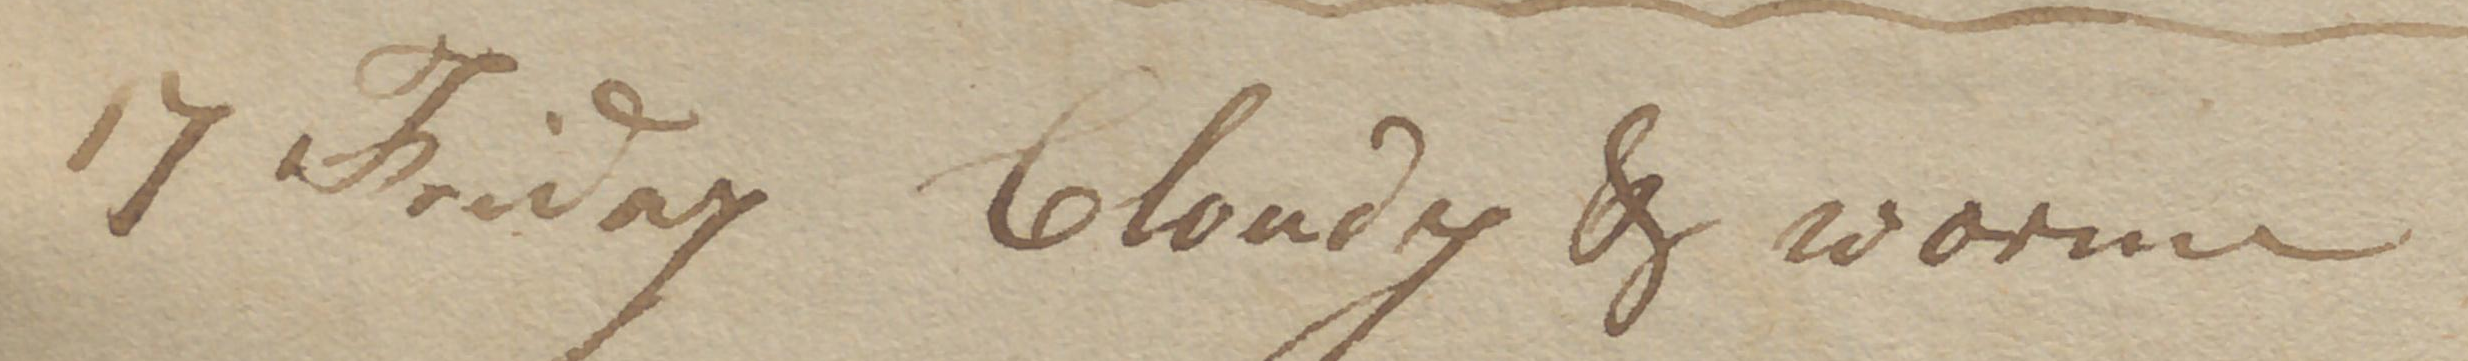17 Friday Cloudy & warme
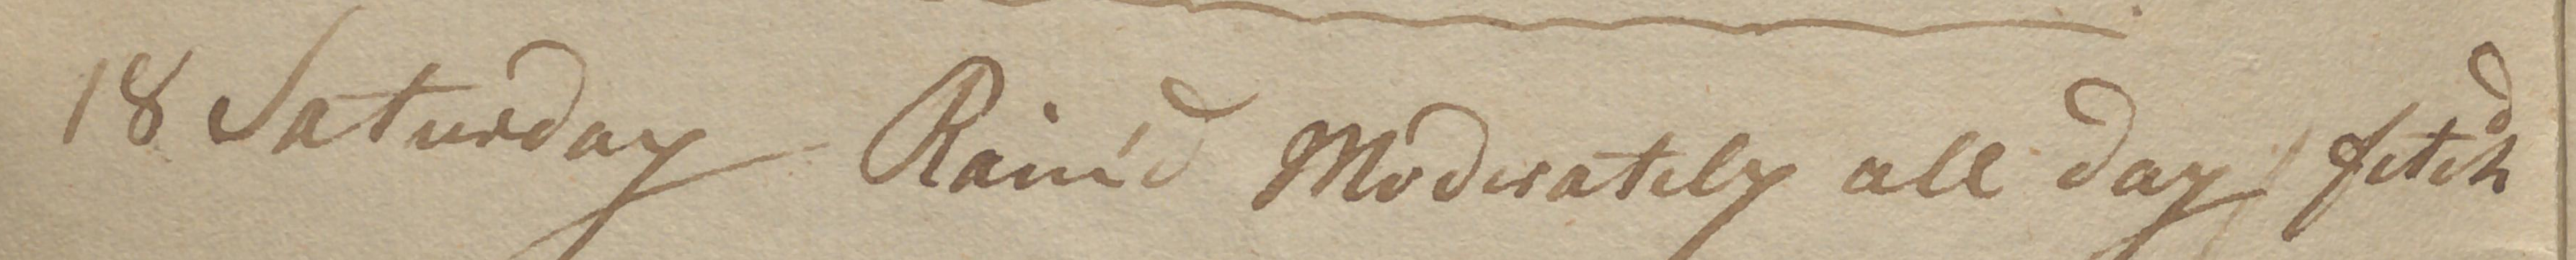18 Saturday Rain'd Moderately all day, fetch^d
